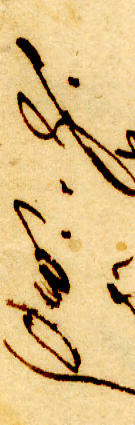dw. g.
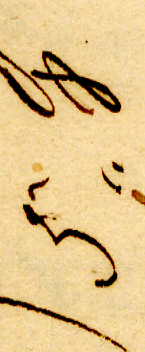5:8
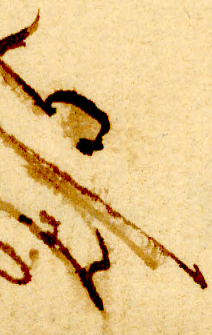2/5
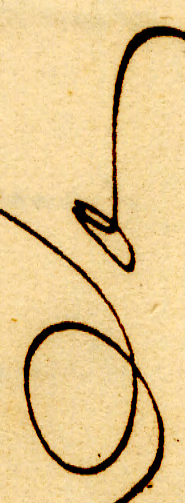To
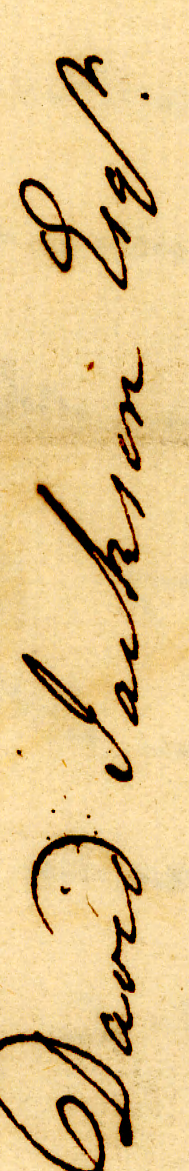David Jackson Esq^r.
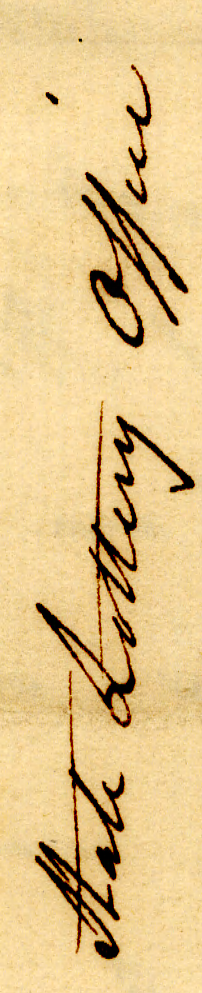State Lottery Office
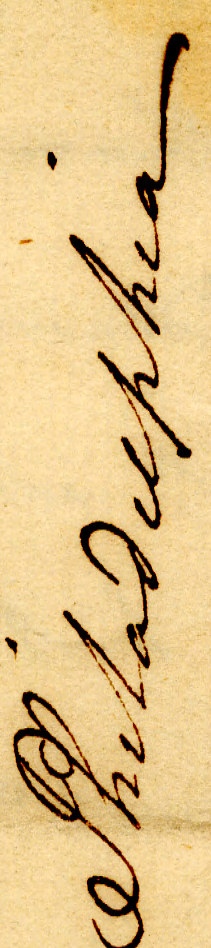Philadelphia
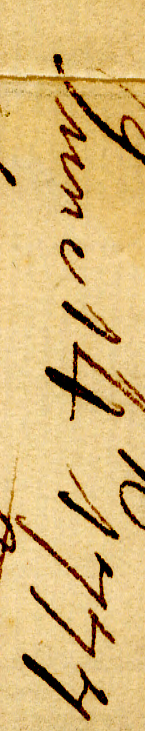June 14^th 1777
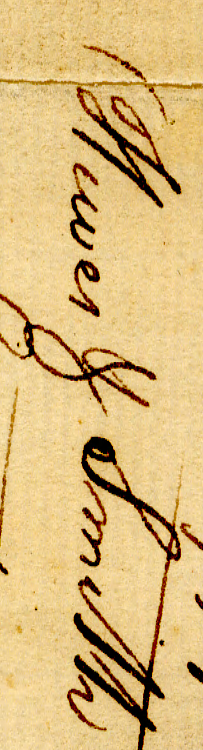Hewes & Smith
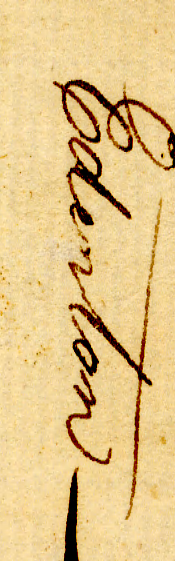Edenton
